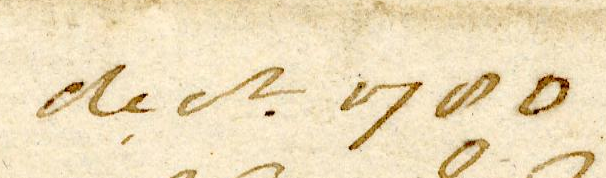dec^r. 178O
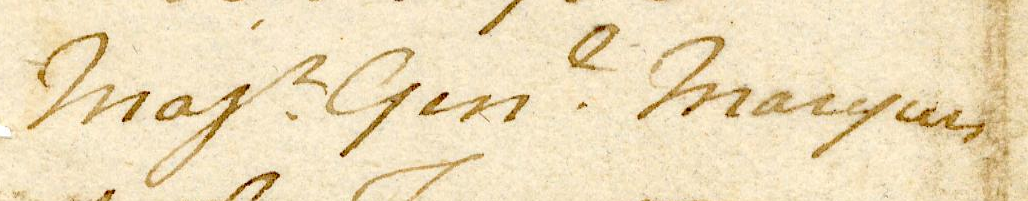Maj^r Gen^l Marquis
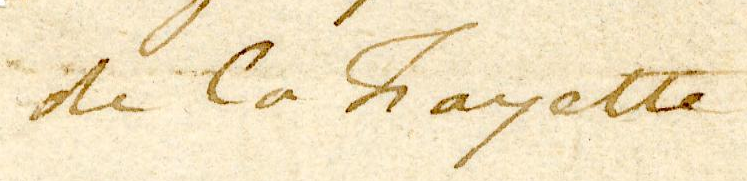de la Fayette
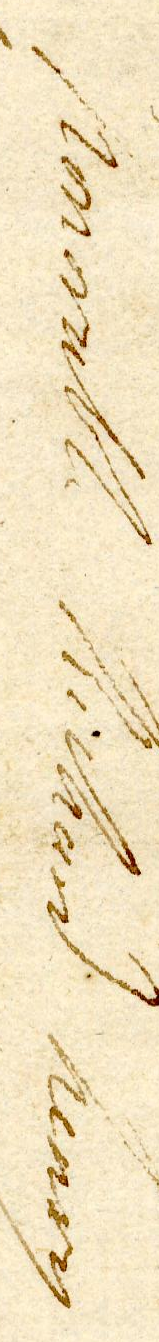Honorable Richard henry
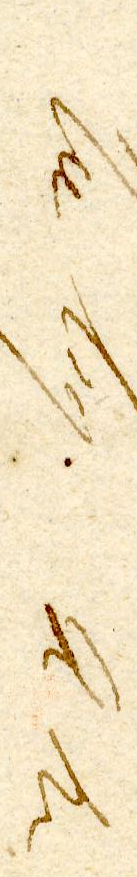lee Esq.
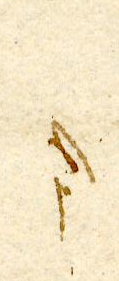at
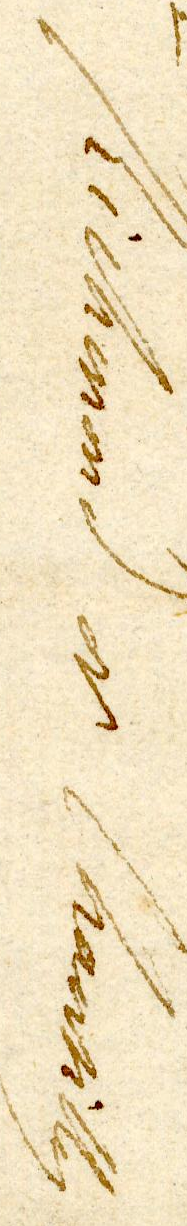Richmond or Chantilly
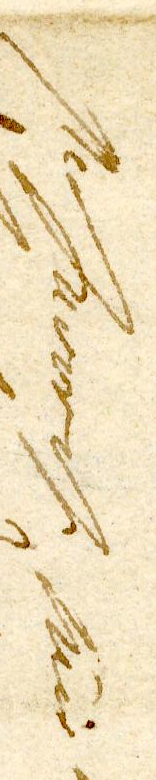per favor of Mess
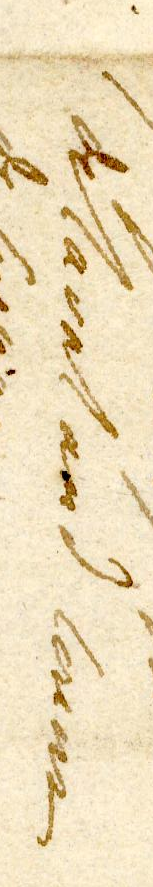de Laval and Courve
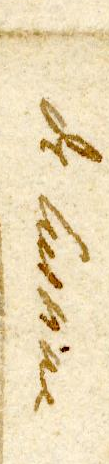de Couriae
